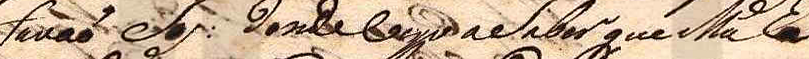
tavaõ sos: donde veyo a saber que ella ha
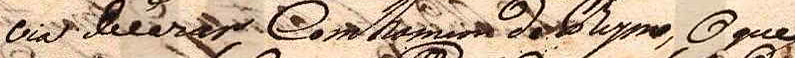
via de cazar Com homem do Reyno, O que
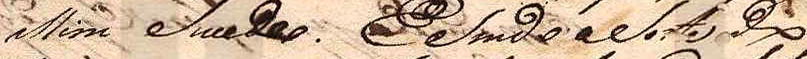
assim Sucedeo. E Sendo a Sorte do
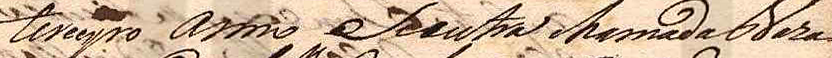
terceyro anno Se outra chamada Naza
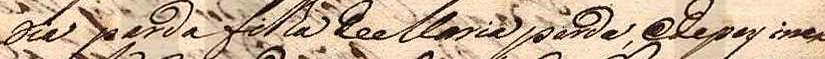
ria parda filha de Maria parda, e de pay inco
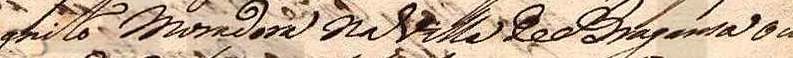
gnito moradora na Villa de Bragansa ou
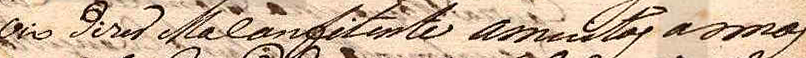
vio dizer ella confitente a muitos annos
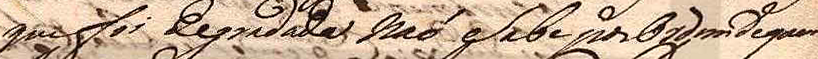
que foi degradada naõ sabe por ordem de quem
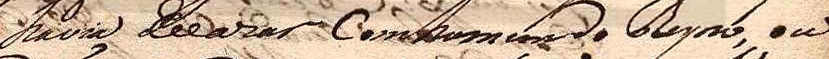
havia de cazar com homem do Reyno, ou
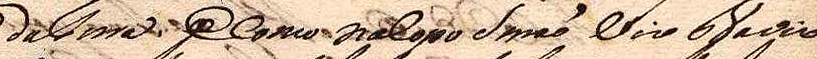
da Terra e como no copo se naõ vio Navio
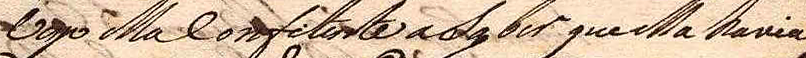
veyo ella confitente a Saber que ella havia
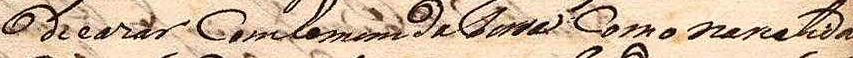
de cazar Com homem da Terra como na realida
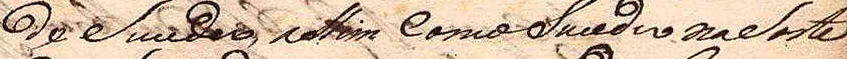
de Sucedeo, assim como Sucedeo na Sorte
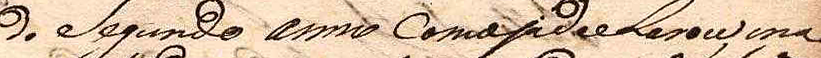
do Segundo anno como ja decLarou, e na
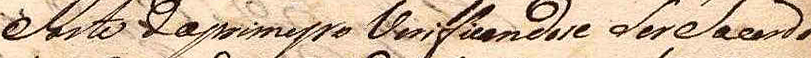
Sorte do primeyro Verificandose ser sacerdo
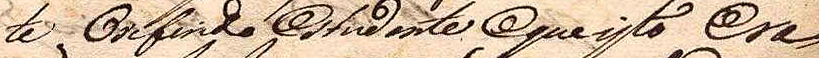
te O referido estudante e que isto era
